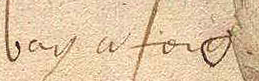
vay a Jorg
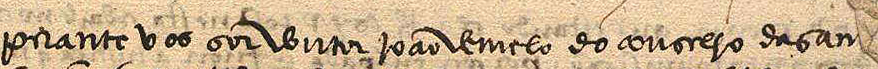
perante vos sōr doutor João de melo do conselho da san
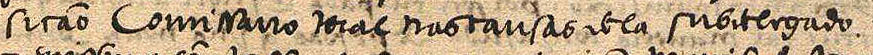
siçaõ Comissario Jeral nas causas dela subdelegado.
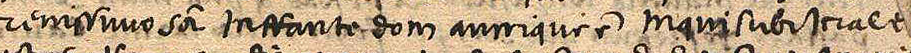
renissimo sōr Jnffante dom anrrique c̄ Jnquisidor Jeral e
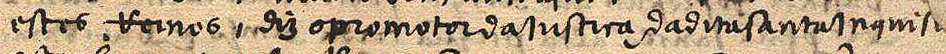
estes Reinos , diz o promotor da Justiça da dita santa Jnquisi
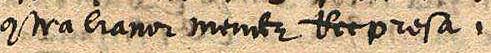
ꝯtra lianor mendez Ree presa
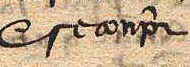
e se conpir
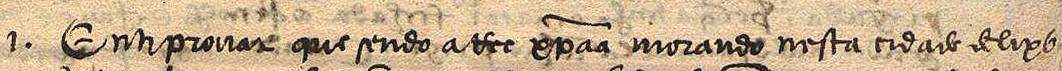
1. Ente prouar que sendo a Ree xpāa morando nesta cidade de lixb
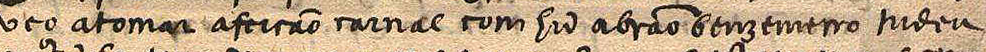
veo a tomar afeicaõ carnal com hū abrão benzemeiro Judeu
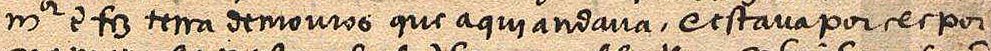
mor ē fez terra de mouros que aquj andaua, e estaua por ele por
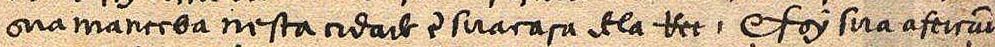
sua manceba nesta cidade ē sua casa dela Ree, e foy sua afeição
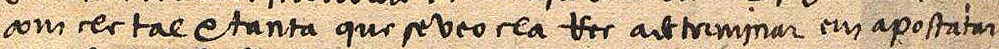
com ele tal e tanta que se veo ela Ree a determinar em apostatar
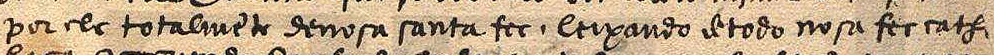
por ele totalmēte de nosa santa fee , leixando de todo nosa fee catho
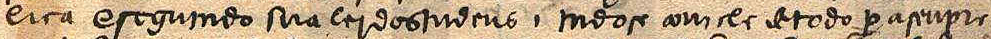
lica e seguindo sua lej dos Judeus , Jndose com ele de todo ꝑa senpre
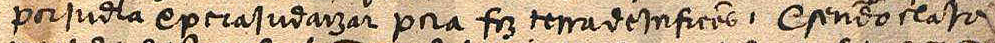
por Judia e pera Judaizar pera fez terra de Jnfiees , e sendo ela Ja
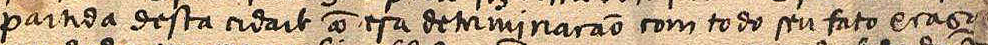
partida desta cidade c̄o esa determjnação com todo seu fato e casa
